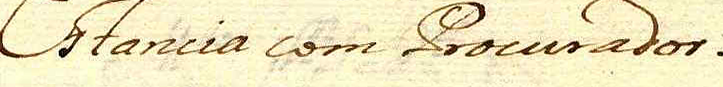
Estancia com Procurador.
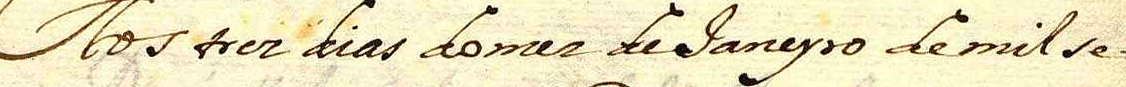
Aos trez dias do mez de Ianeyro de mil se
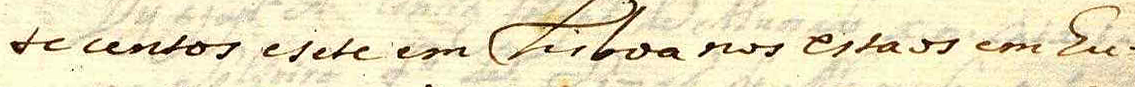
tecentos e sete em Lisboa nos estaos em hu
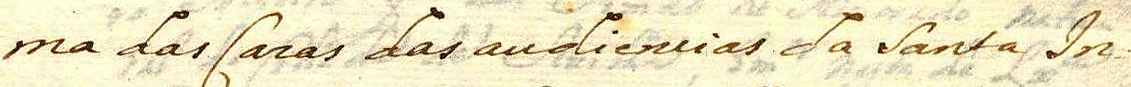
ma das Cazas das audiencias da Santa In
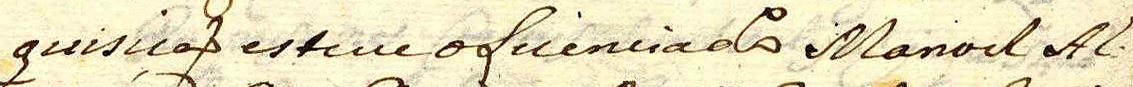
quisiçaõ esteue o Licenciado Manoel Al
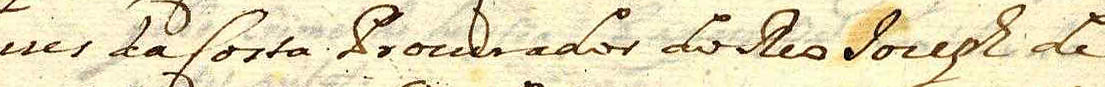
ues da Costa Procurador do Reo Iozeph de
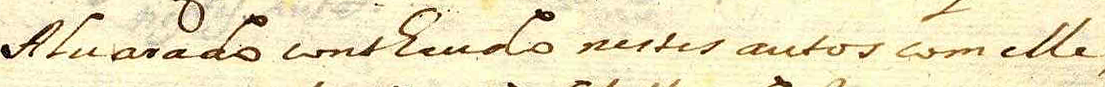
Aluarado contheudo nestes autos com elle,
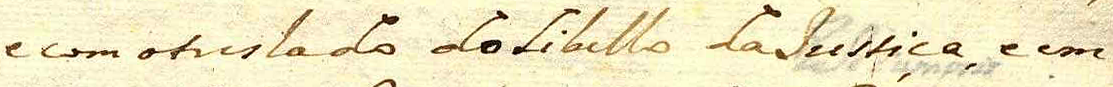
e com o treslado do Libello da Iustiça, e em
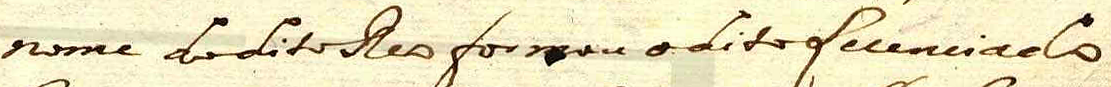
nome do dito Reo formou o dito Lecenciado
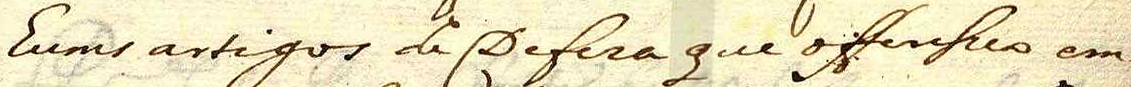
hums artigos de Defeza que offeresseo em
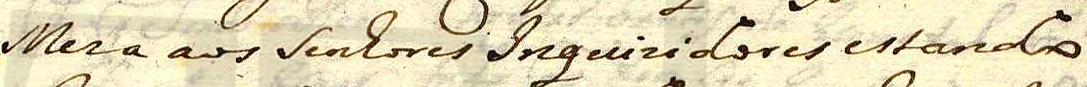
Meza aos Senhores Inquizidores estando
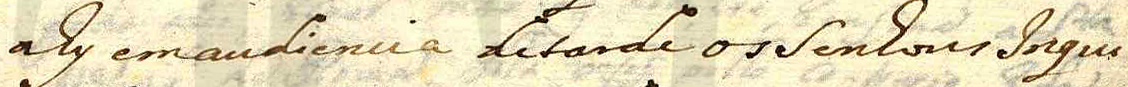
ahy em audiencia de tarde os Senhores Inqui
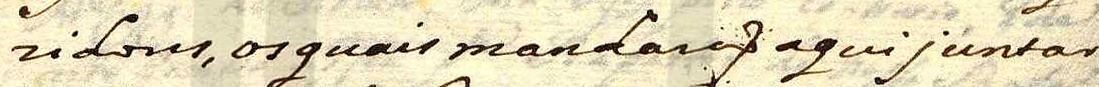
zidores, os quais mandaraõ aqui juntar
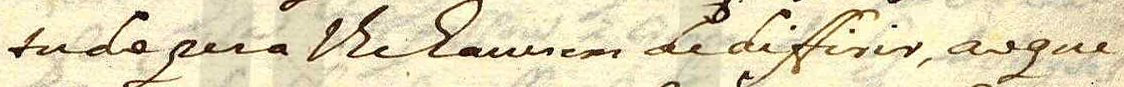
tudo pera lhe hauerem de diffirir, ao que
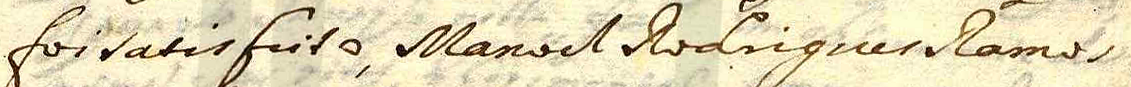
foi satisfeito, Manoel Rodrigues Ramos
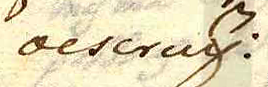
o escreuy:
